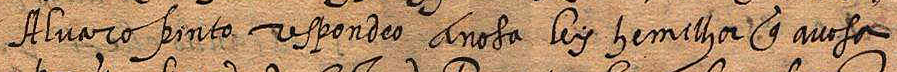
Aluaro pinto respondeo a nosa ley he milhor q̄ a uosa
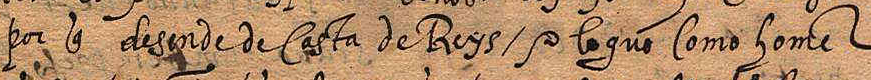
porq̄ desende de Casta de Reys / e loguo Como homē
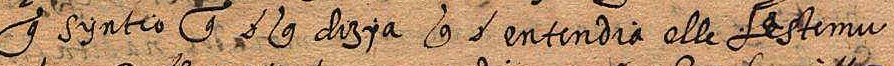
q̄ syntio q̄ o q̄ dizya q̄ o entendia elle testemu
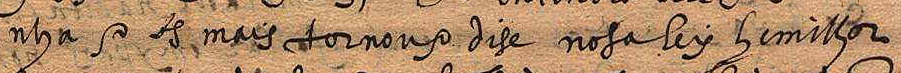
nha e os mais tornou e dise nosa ley he milhor
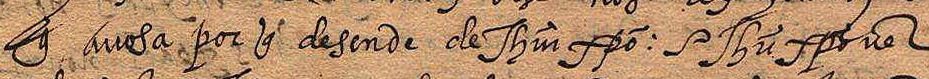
q̄ a uosa porq̄ desende de Jhūu xpō: e Jhū xpō uē
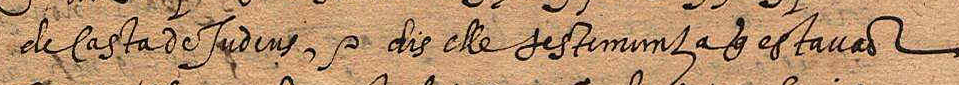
de Casta de Judeus, e dis elle testemunha q̄ estauaõ
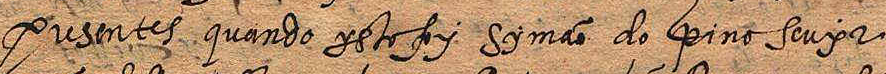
presentes quando ysto foy Symaõ do pino seu yr
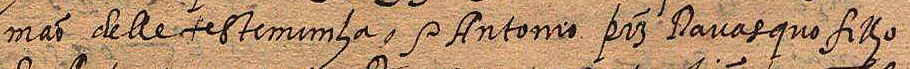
maõ delle testemunha, e Antonio piz̄ Rauasquo filho
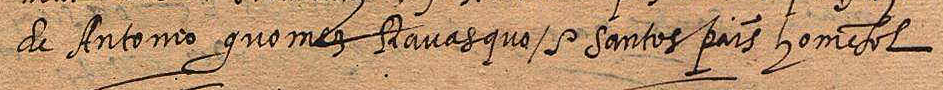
de Antonio guomez Rauasquo / e Santos pais homē soL
